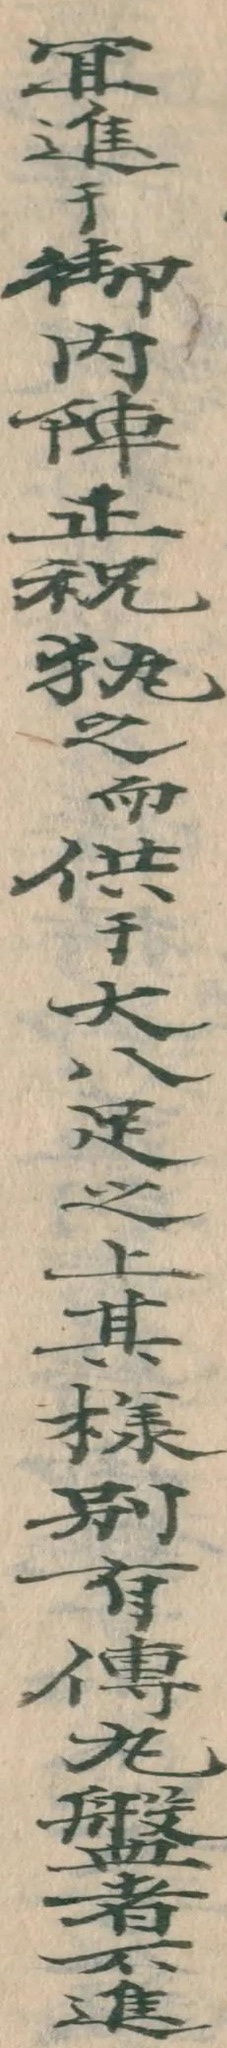宜進于御内陣正祝執之而供于大八足之上其様別有伝丸盤者不進
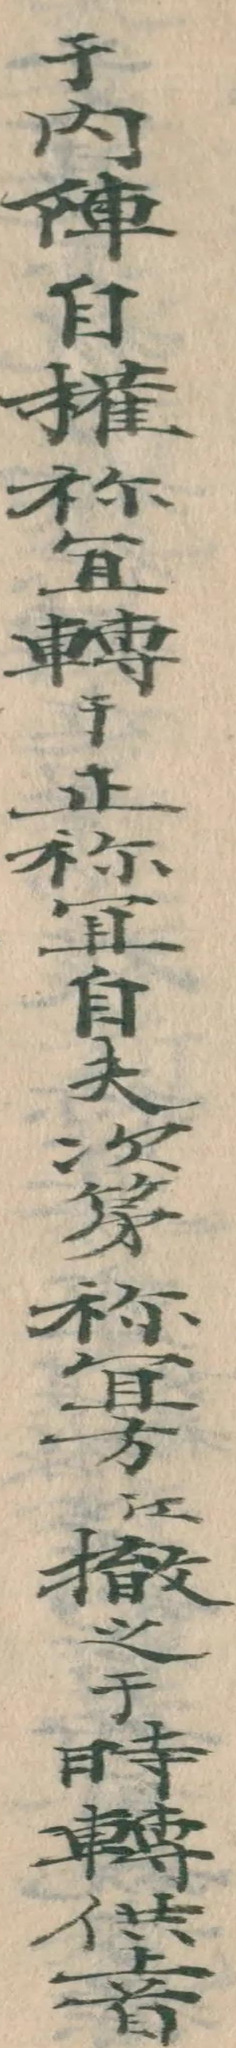于内陣自權祢宜転于正祢宜自夫次第祢宜方江撤之于時転供上首
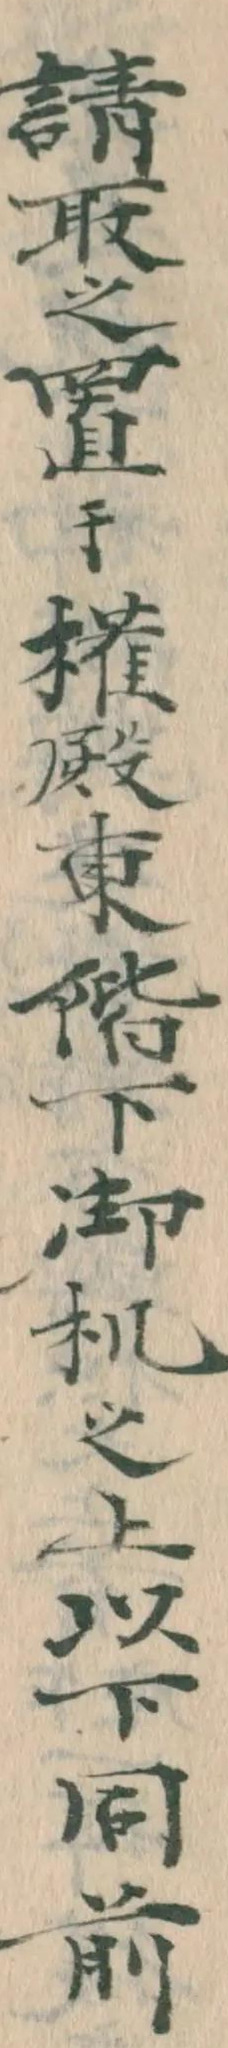請取之置于権殿東階下御机之上以下同前

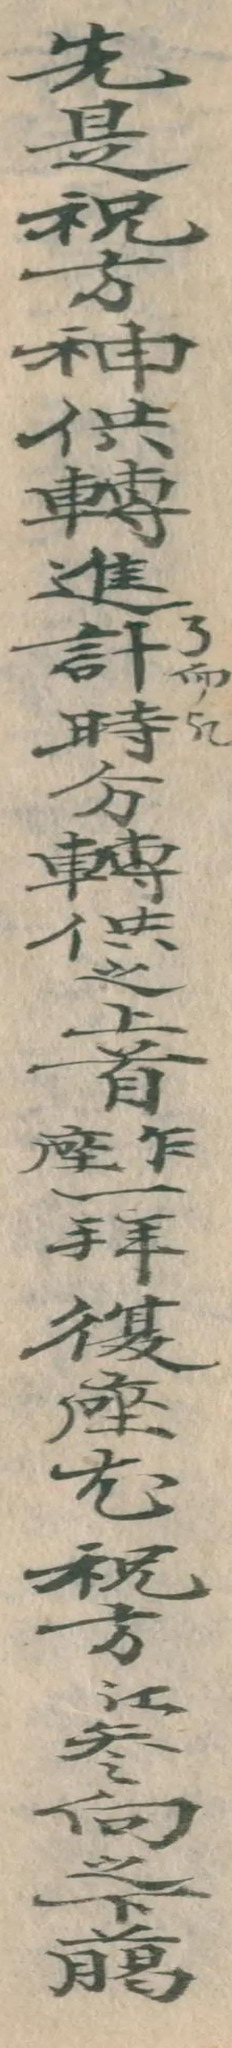先是祝方神供転進計時分転供之上首乍座一拝復座尤祝方江参向之下臈
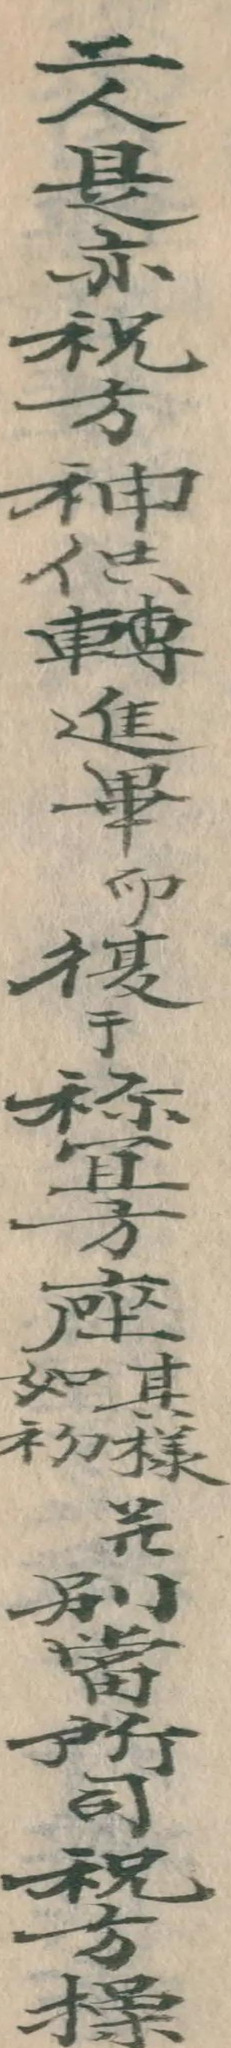二人是亦祝方神供転進畢而復于称宜方座其様如初并別当所司祝方操
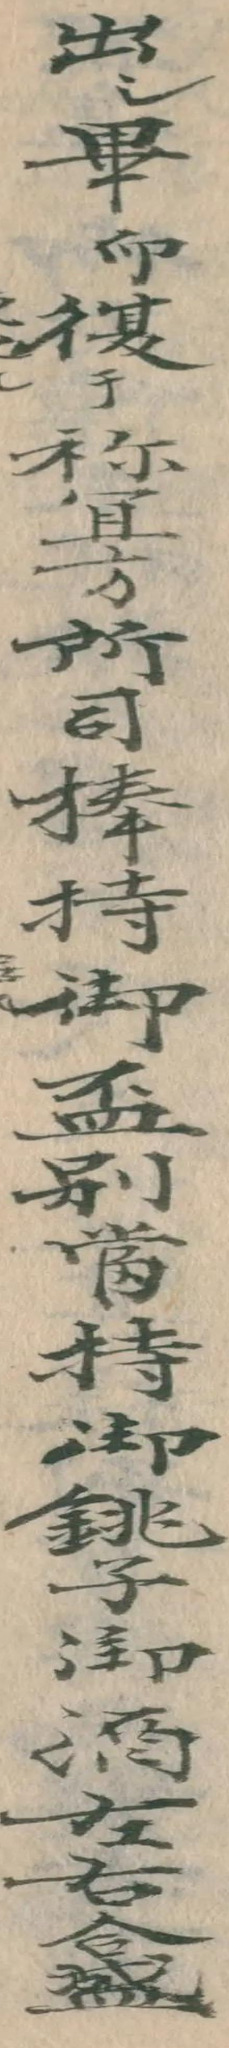出シ畢而復于称冝方所司捧持御盃別当持御銚子御酒左右合盛
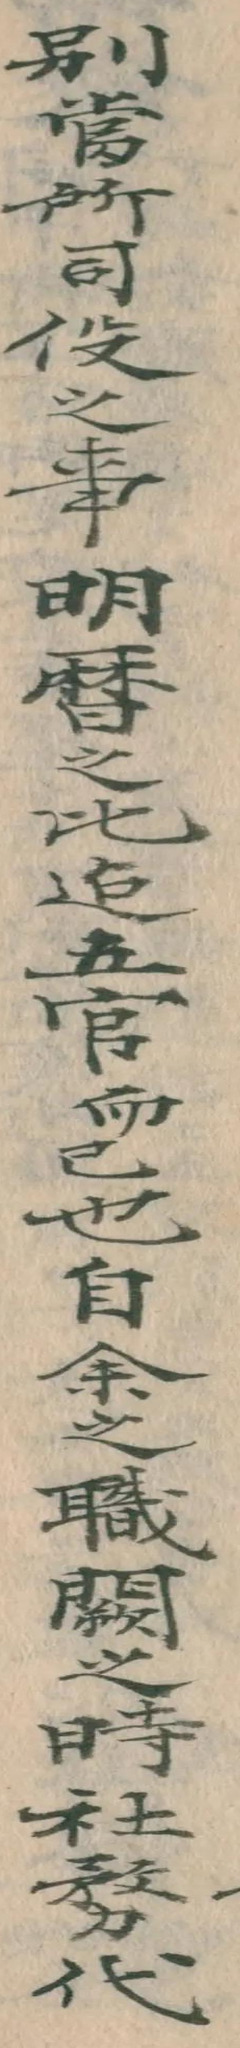別当所司役之事明暦之比迄五官而已也自余之職闕之時社務代
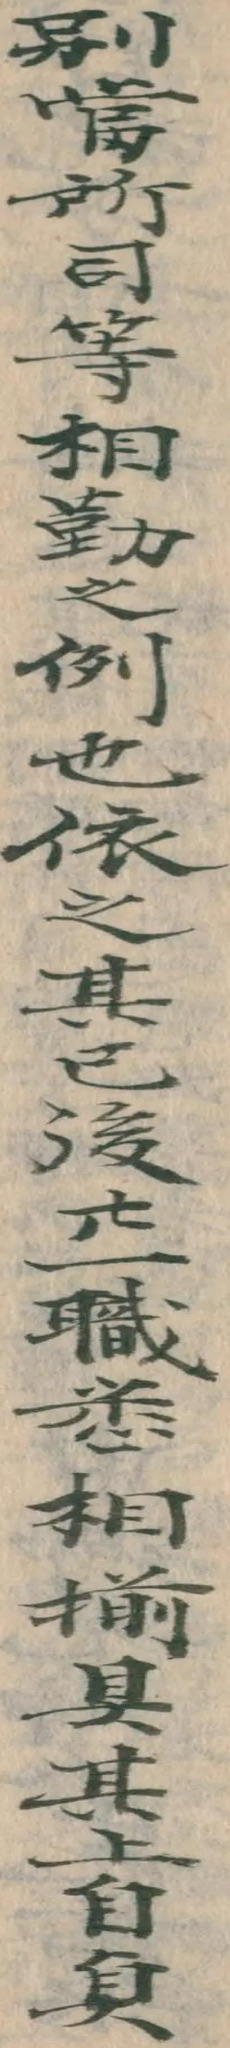別当所司等相勤之例也依之其已後廿一職悉相揃具其上自貞
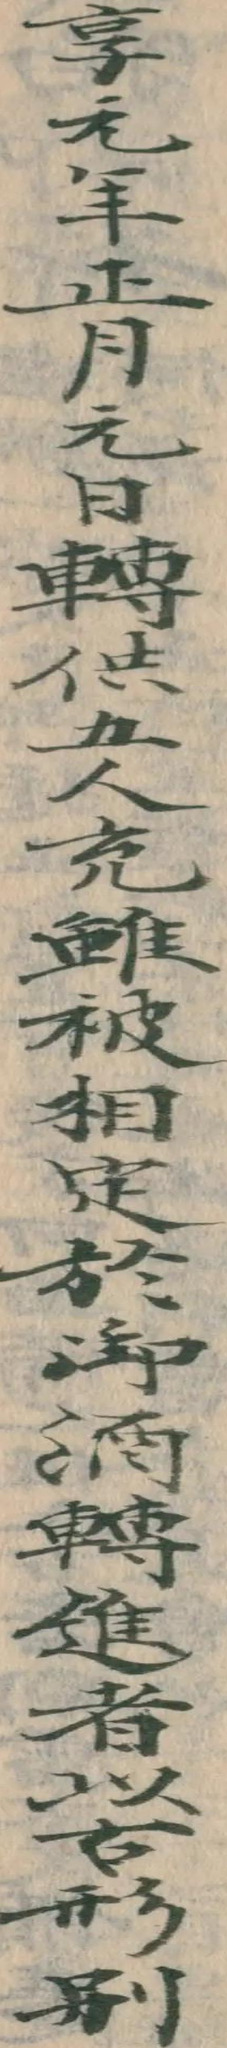享元年正月元日転供五人充雖被相定於御酒転進者以古形別
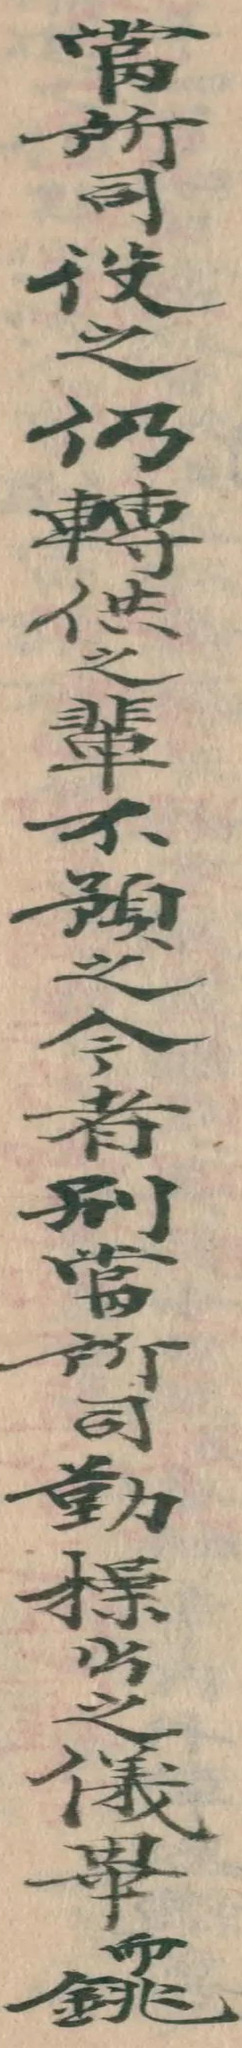当所司役之仍転供之輩不預之今者別当所司勤操出之儀畢而銚
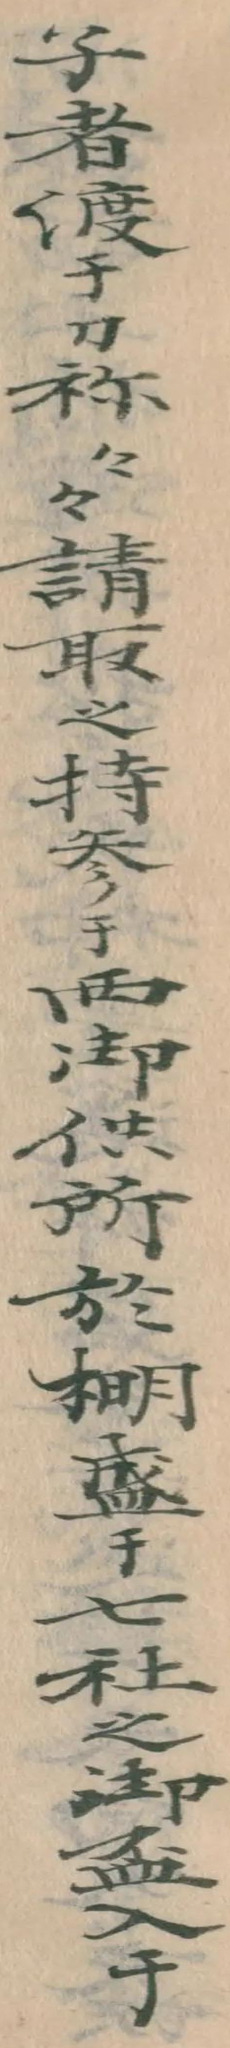子者渡于刀称々々請取之持参于西御供所於棚盛于七社之御盃入于
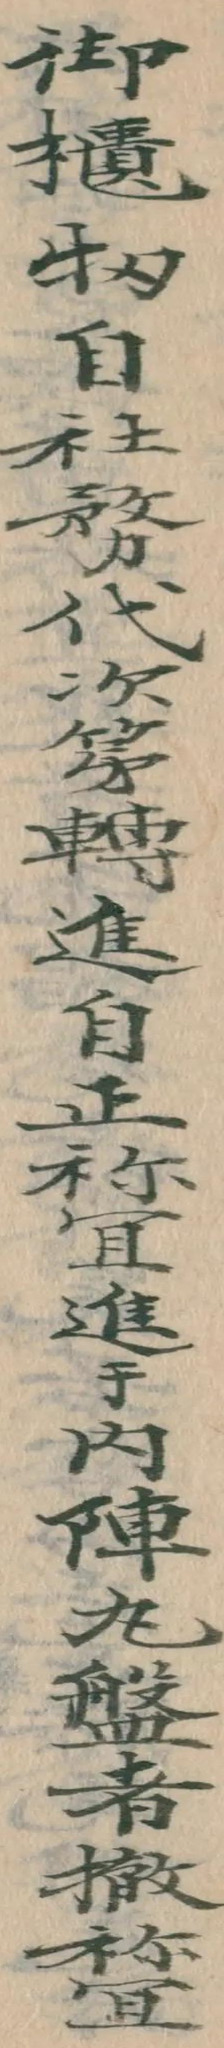御櫃物自社務代次第転進自正弥宜進于内陣丸盤者撤称宜
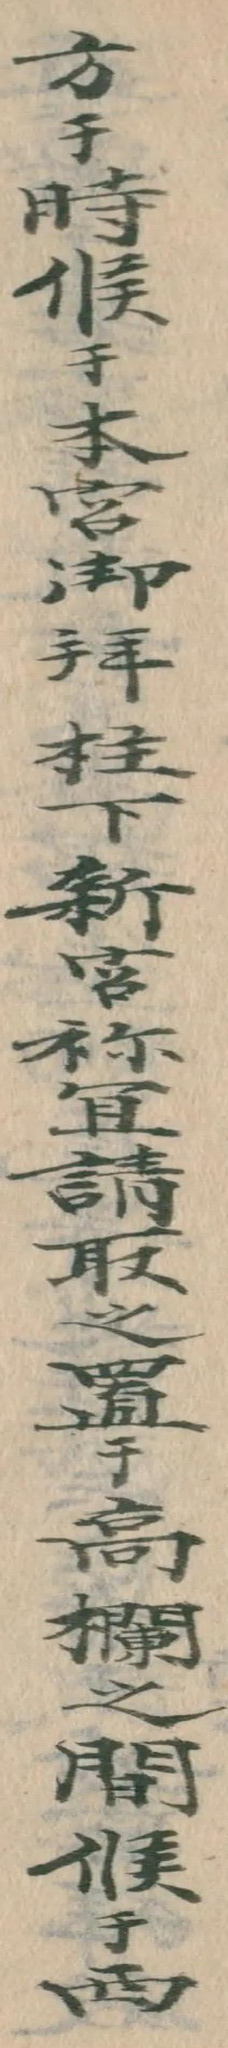方于時候于本宮御拝柱下新宮祢宜請取之置于高欄之間候于西
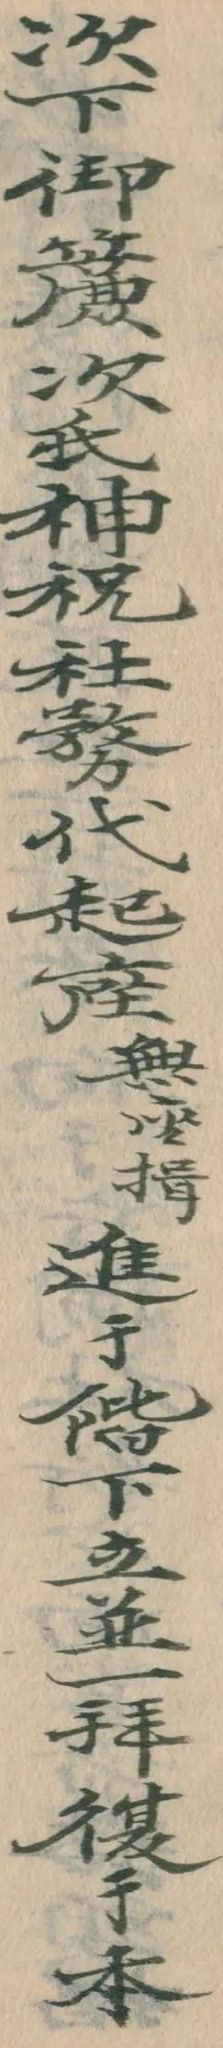次下御簾次氏神祝社務代起座無座揖進于階下立並一拝復于本
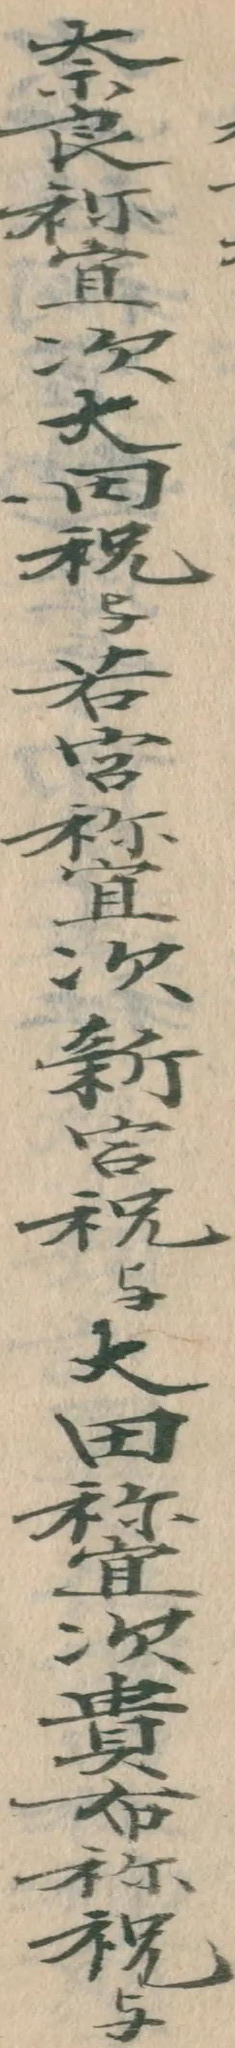奈良祢宜次大田祝与若宮祢宜次新宮祝与大田称宜次貴ふね祝与
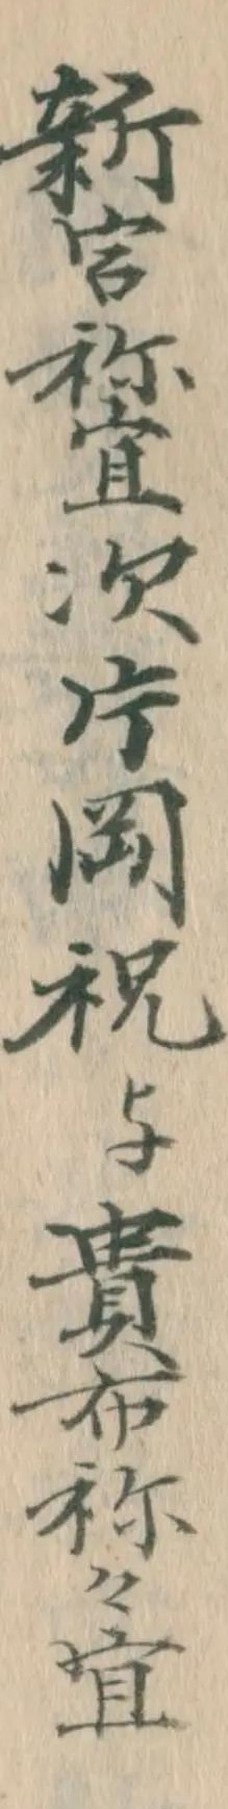新宮祢宜次片岡祝与貴ふね々宜
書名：賀茂社記録. 第9冊
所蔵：国立国会図書館 National Diet Library, JAPAN
